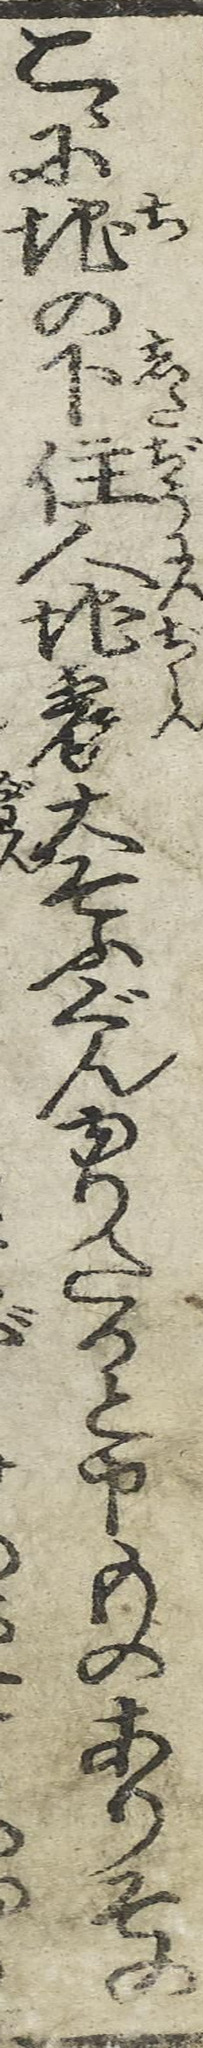こゝに地の下住人地震大そふぐんゆりたりと申ものありその
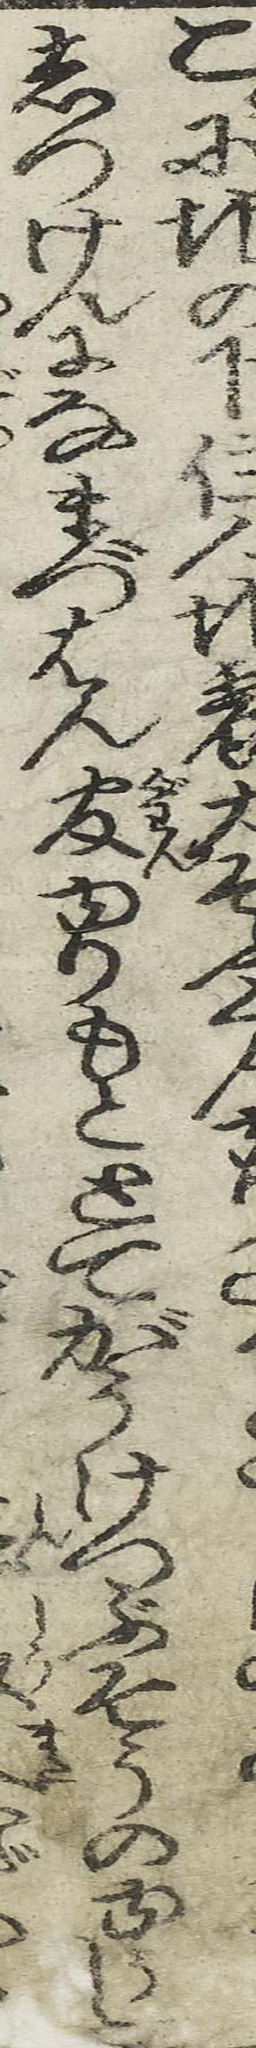しつけんになまづはん官ゆりもとさてがうけつぶそうのゆうし
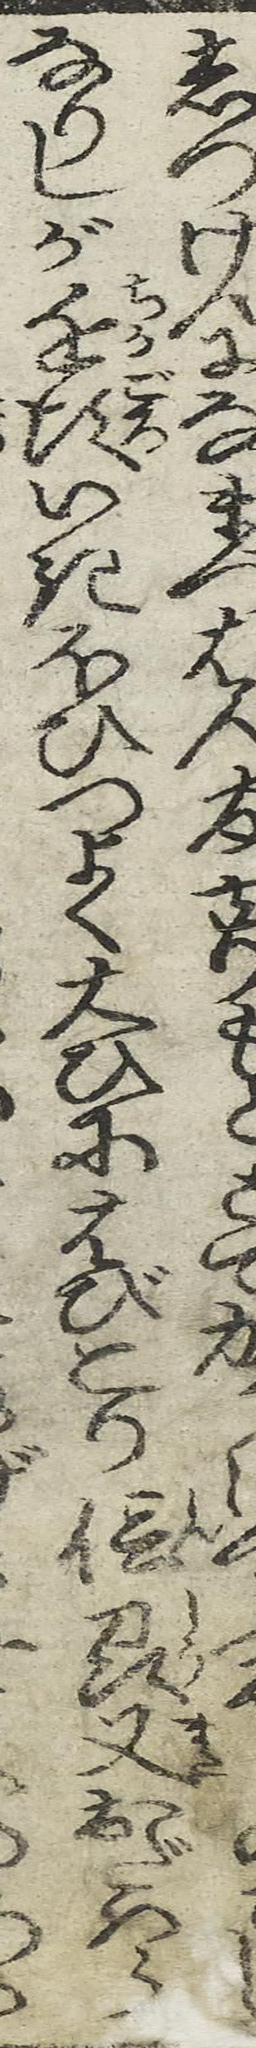なりしが近頃いきほひつよく大ひにはびこり信州又おだはら
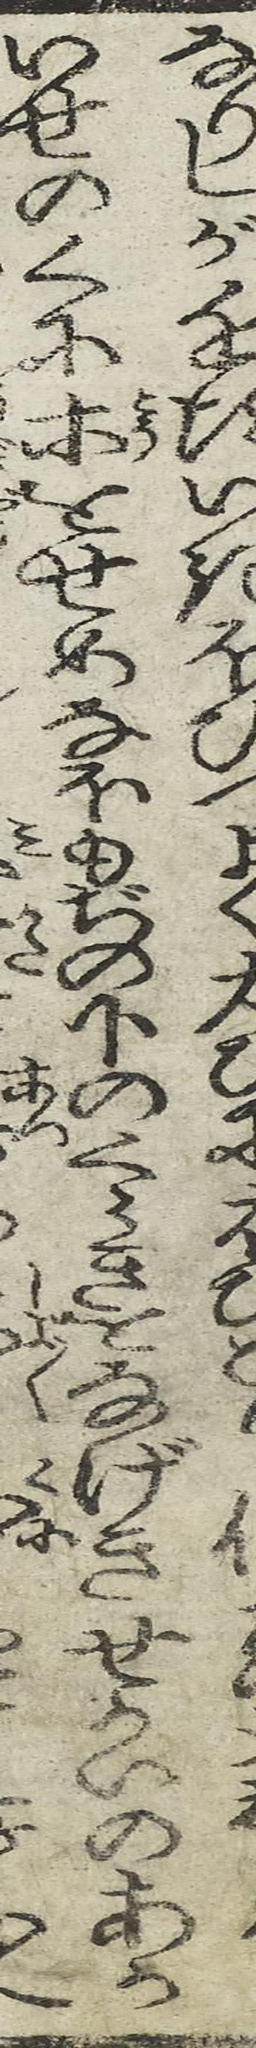いせのくに等をせめなほもぢの下のくらきをなげきせかいのあか
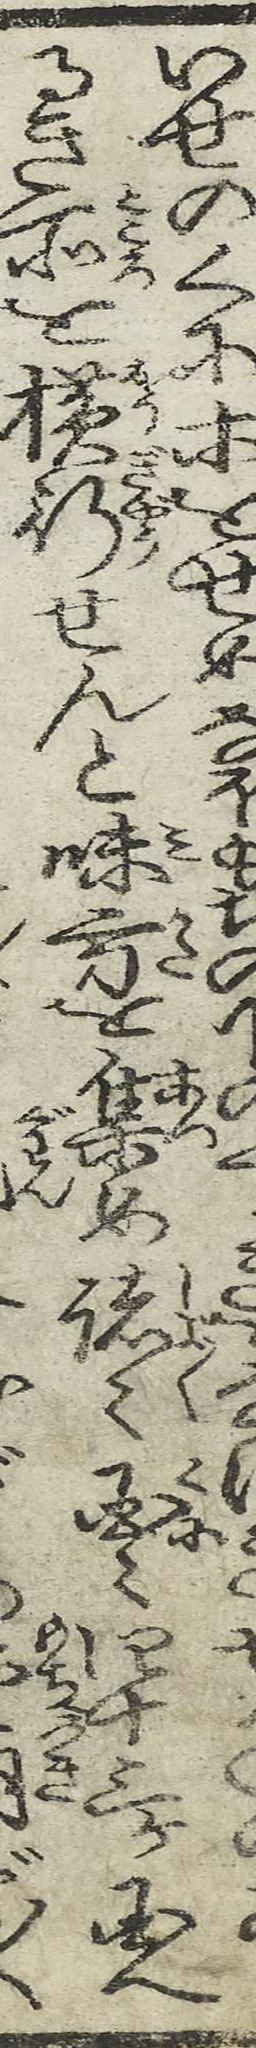るき所を横行せんと味方を集め諸〻国〻四十三ヶ国へ
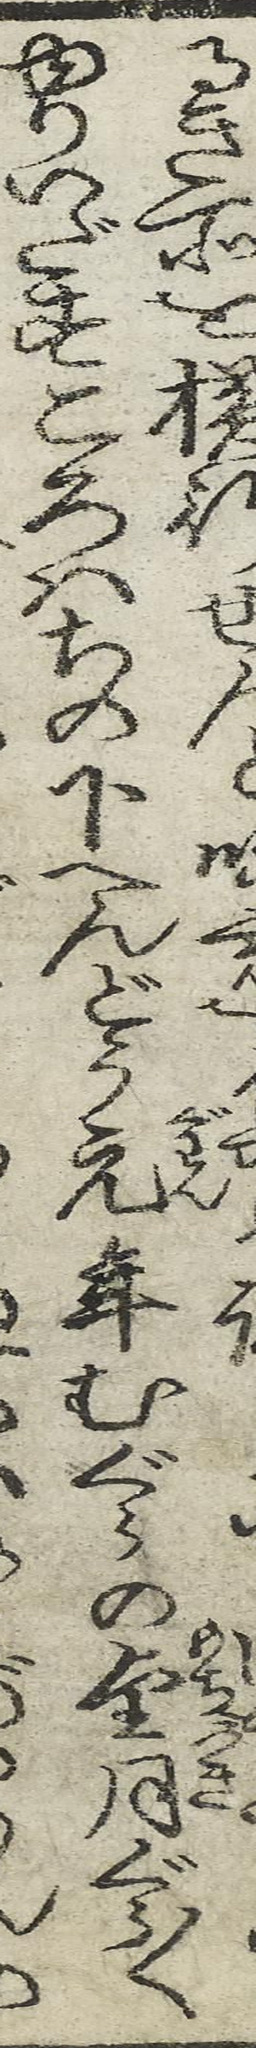ゆりいだすころはちの下へんどう元年むぐらの望月ぐら〳〵
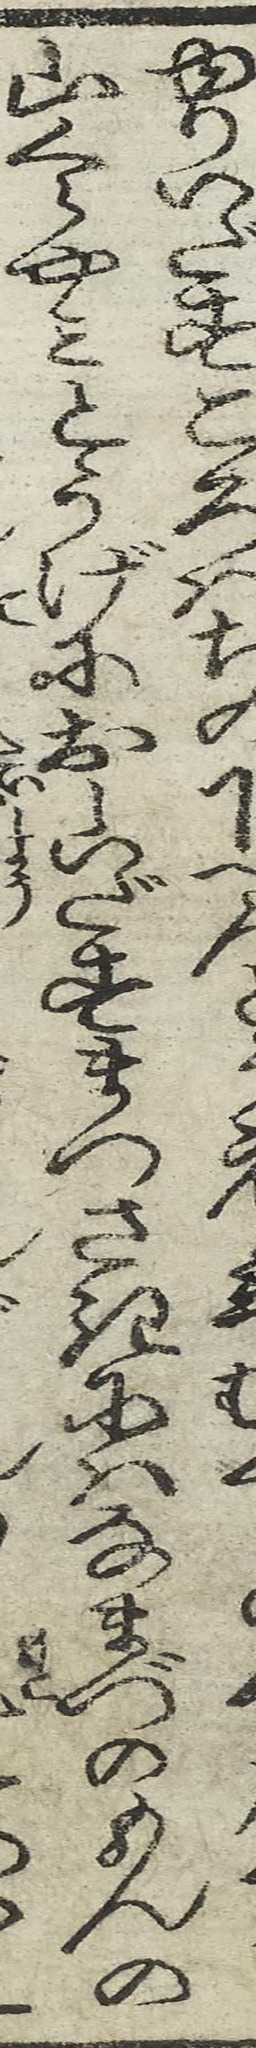山くらやみとうげにおしいだすまつさきにはなまづのもんの
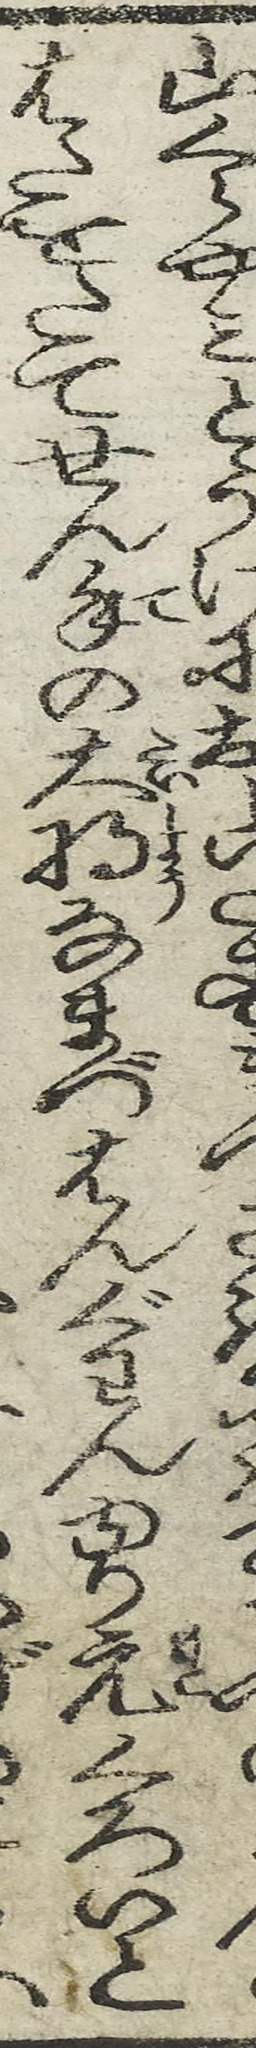はたをたてせん手の大将なまづはんぐわんゆり元くろいと
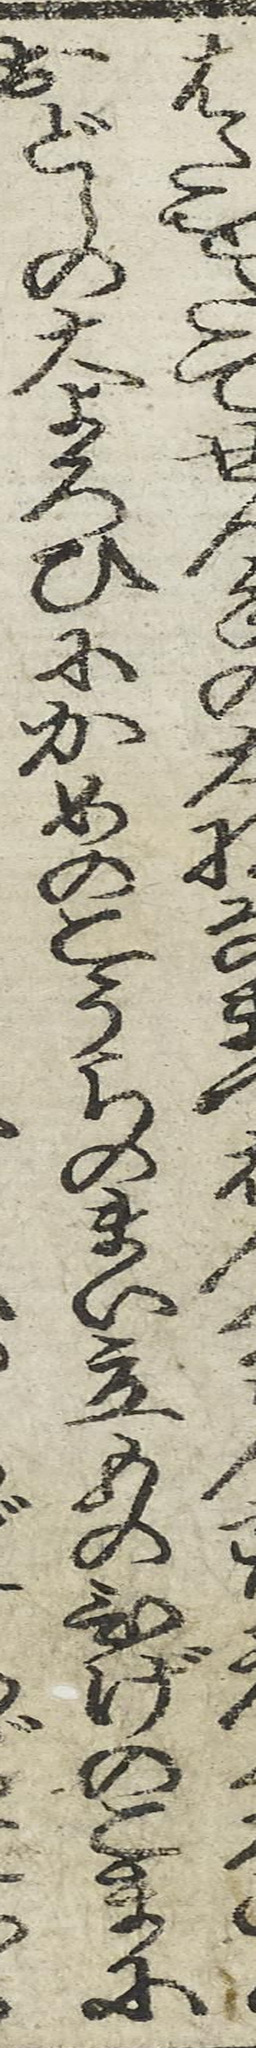おどしの大よろひにかめのこうらのまい立ものひげのこまに
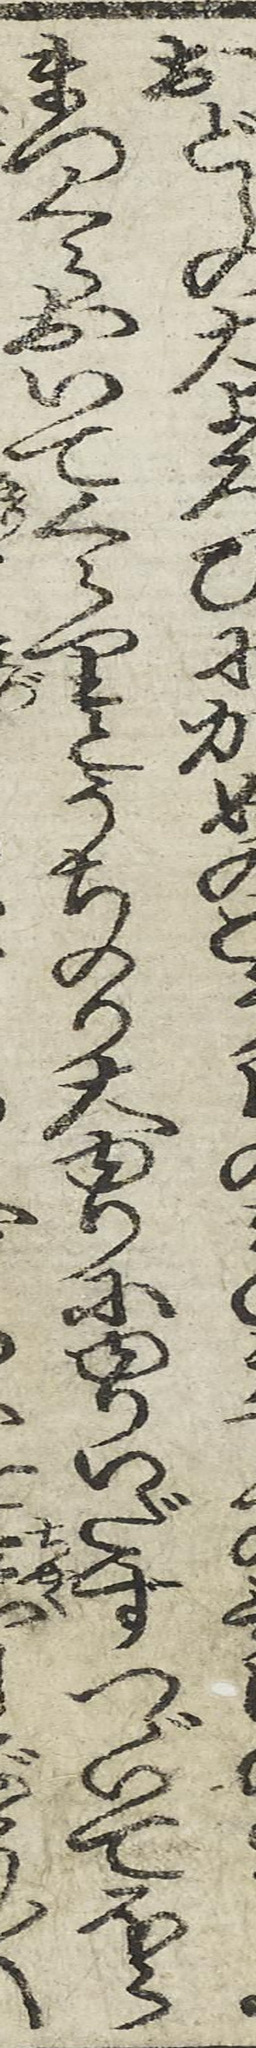まつくらおいてくらりとうちのり大ゆりにゆりいだすつゞいてほら
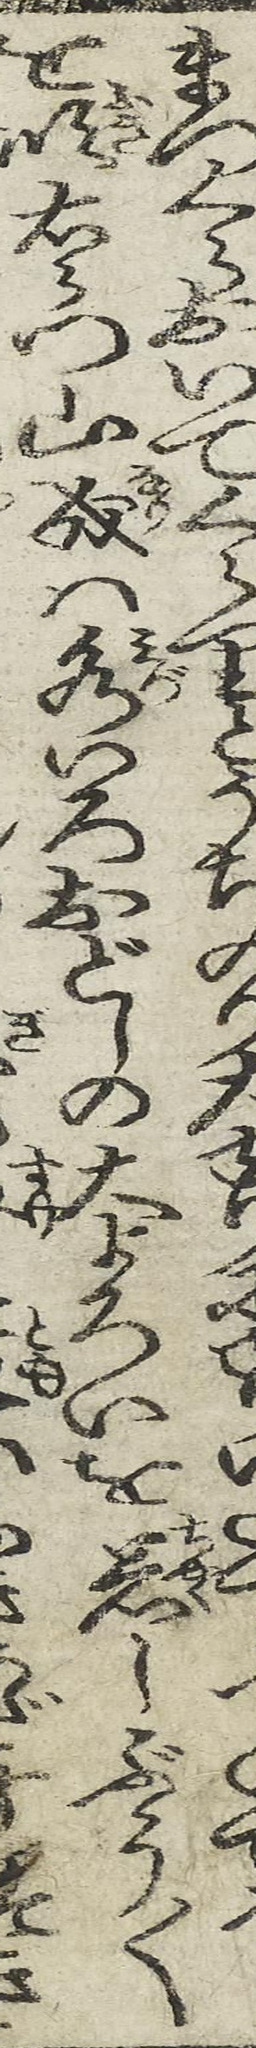を吹右衛門山成へ水いろおどしの大よろいを着しぶう〳〵
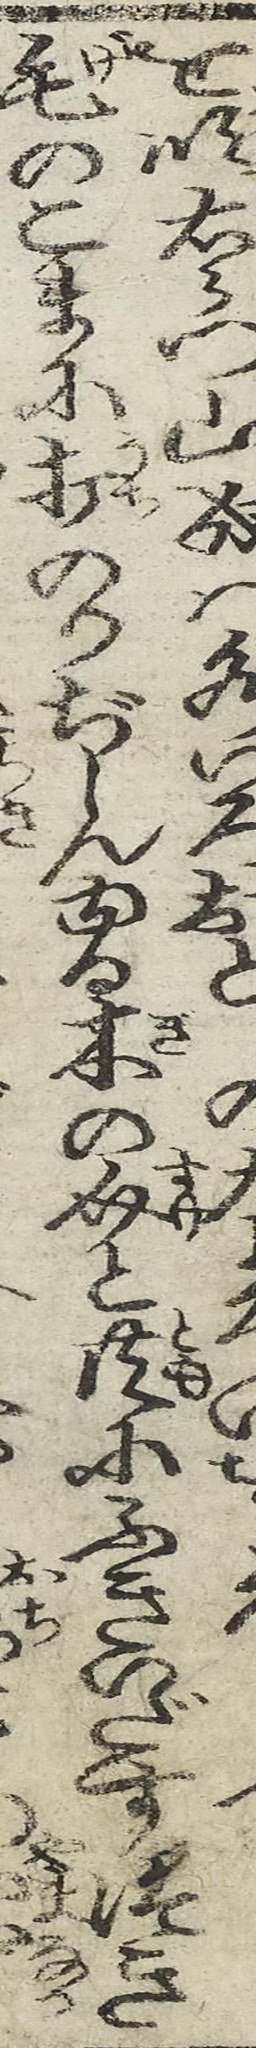毛のこまに打のりぢしんゆる木の介と共にふきいだすつき
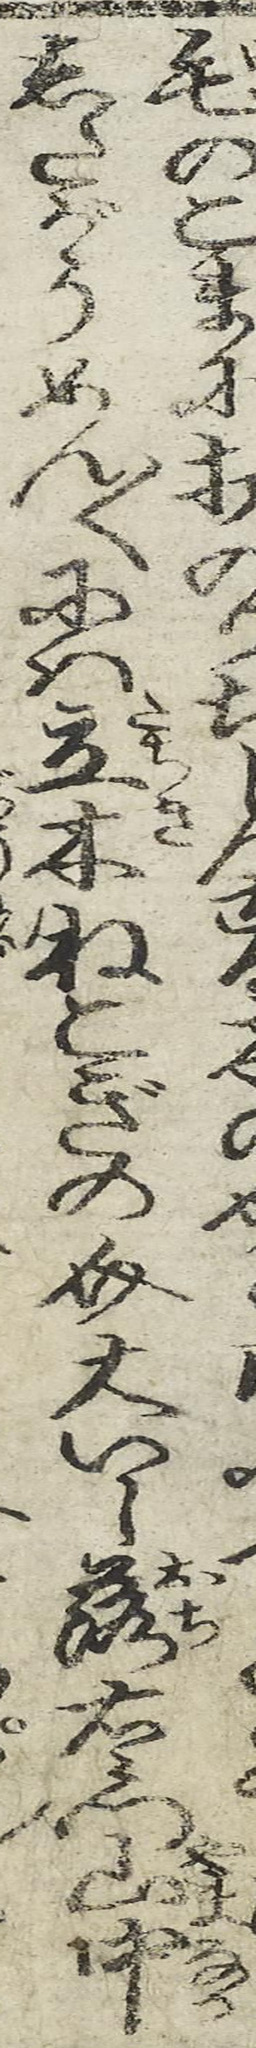したがうめん〳〵には立木ねこぎの介大いし落右衛門山中
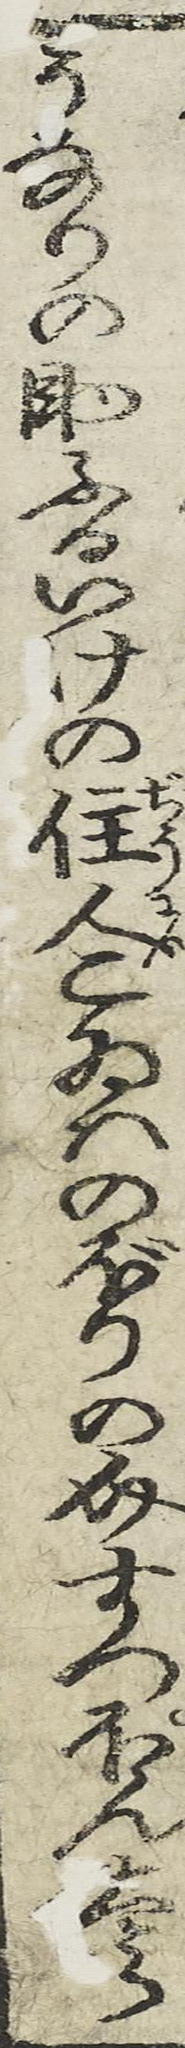うなりの助ふるいけの住人こゐはのぼりの介すつぽん太郎
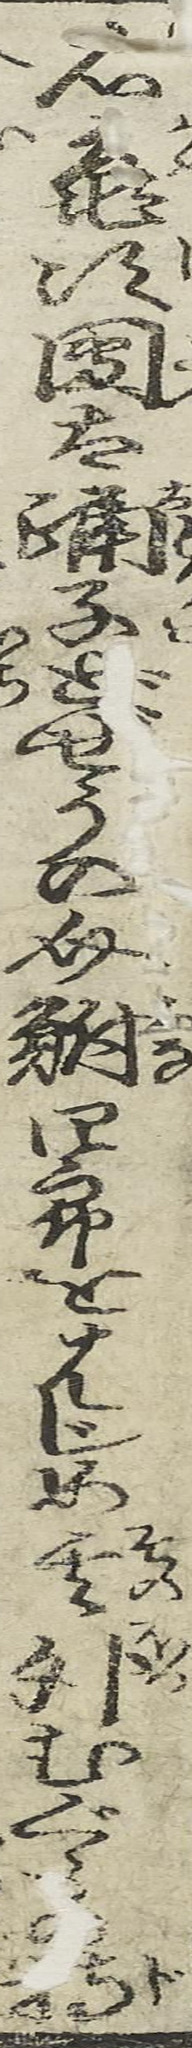石亀次團太踊子どぜうの介鮒四郎をはじめ其外むぐらの持
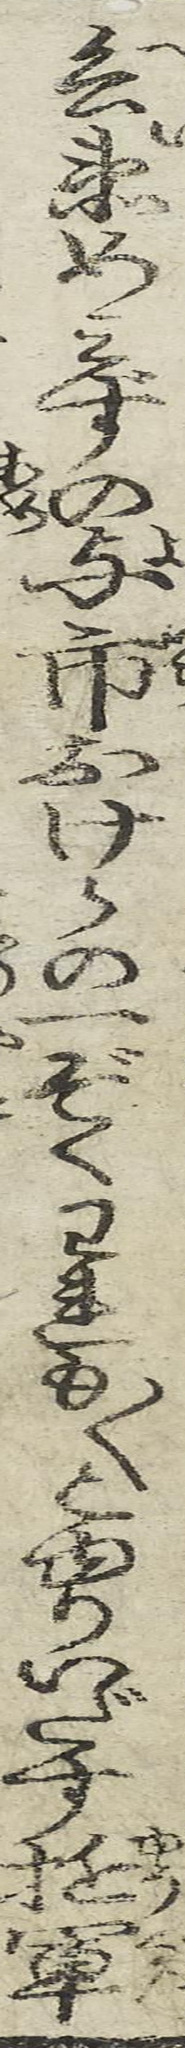兵衛めみずの与市おけらの一ぞくわれも〳〵とゆりいだす遊軍
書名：新板ぢしん太平記
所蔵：東京大学地震研究所図書室 Earthquake Research Institute Library, The University of Tokyo, JAPAN
